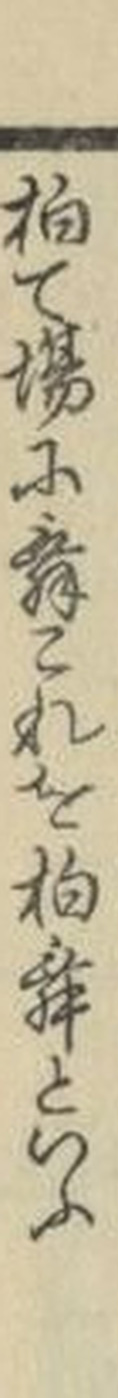拍て場に舞これを拍舞といふ
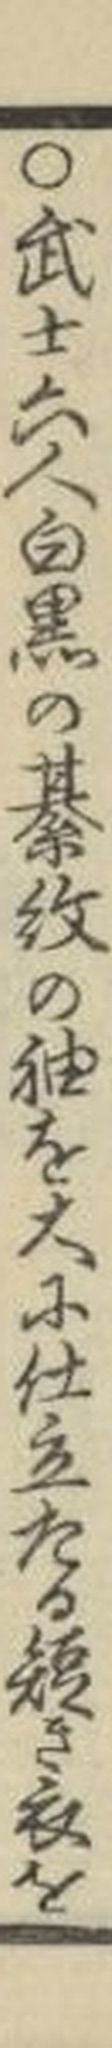○武士六人白黒の綦紋の袖を大に仕立たる短き衣を
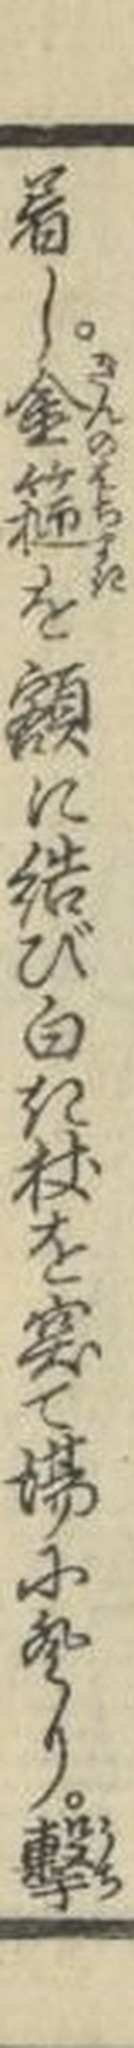着し。金箍を額に結び白き杖を突て場に登り。撃
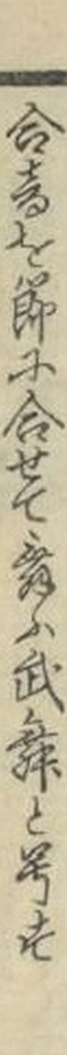合音を節に合せて舞ふ武舞と号す
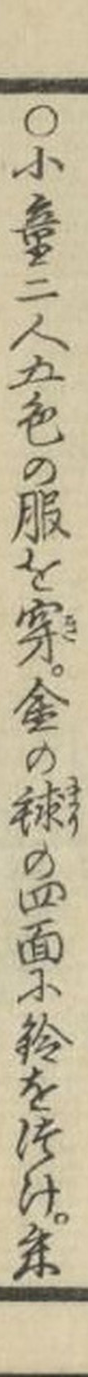○小童二人五色の服を穿。金の毬の四面に鈴をつけ。朱
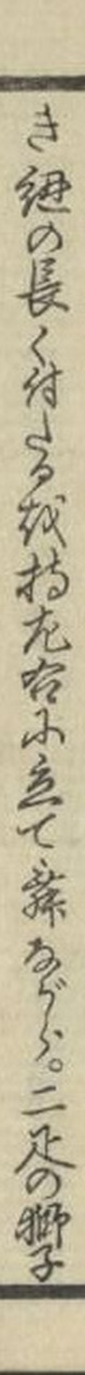き紐の長く付たるを持左右に立て舞ながら。二疋の獅子
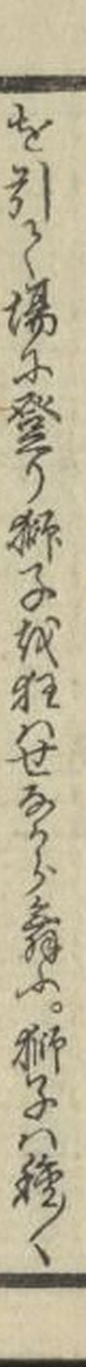を引て場に登り獅子を狂はせなから舞ふ。獅子は種〳〵
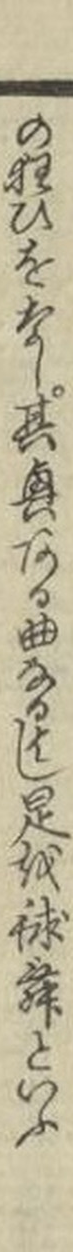の狂ひをなし。其興ある曲なるはし是を球舞といふ
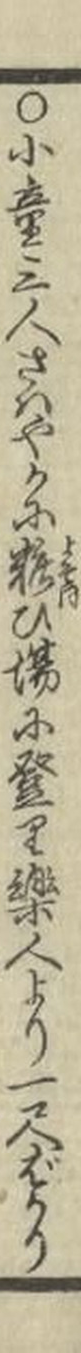○小童三人さはやかに粧ひ場に登り楽人より一尺ばかり
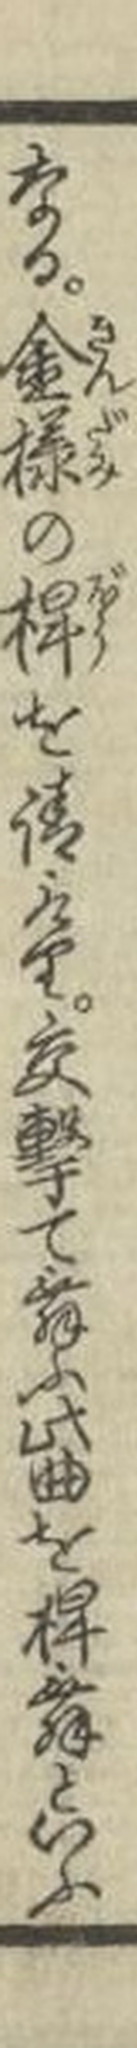なる。金様の桿を請取り。交撃て舞ふ此曲を桿舞といふ
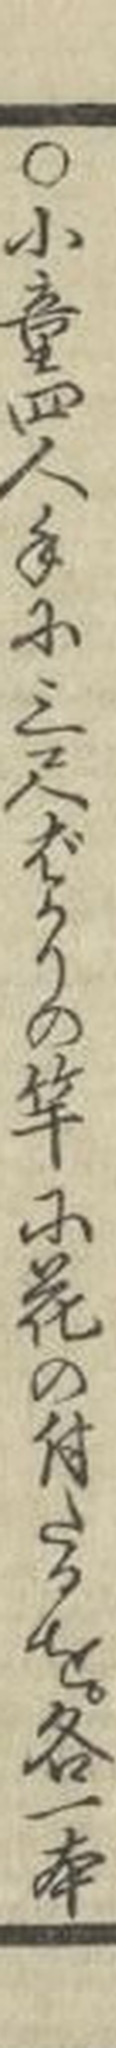○小童四人手に三尺ばかりの竿に花の付たるを。各一本
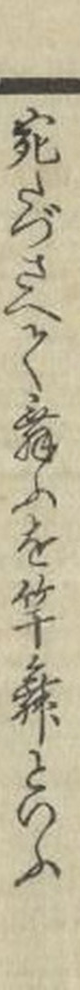宛たづさへて舞ふを竿舞といふ
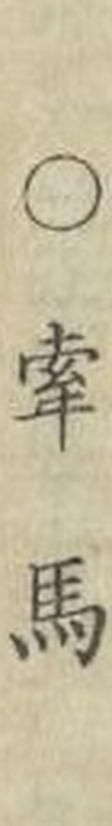○牽馬

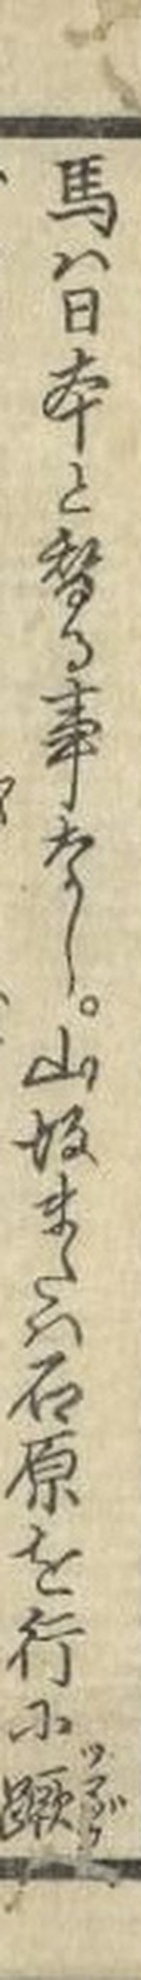馬は日本と替る事なし。山坂または石原を行に蹶
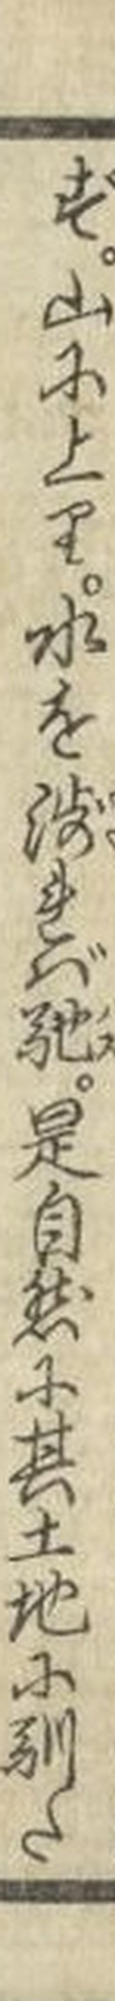ず。山に上り。水を渉れば馳。是自然に其土地に馴た
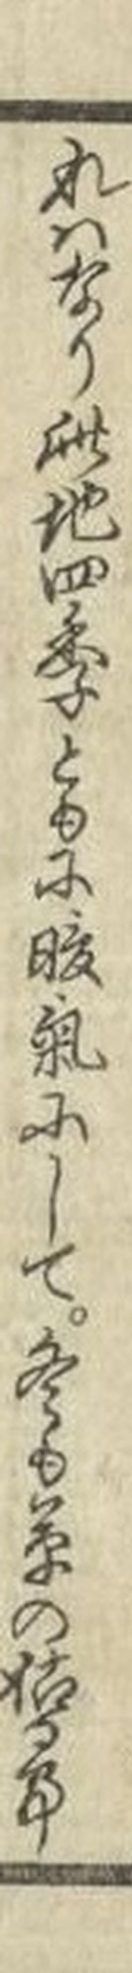れはなり此地四季ともに暖気にして。冬も草の枯る事
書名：琉球解語
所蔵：University of the Ryukyus Library
